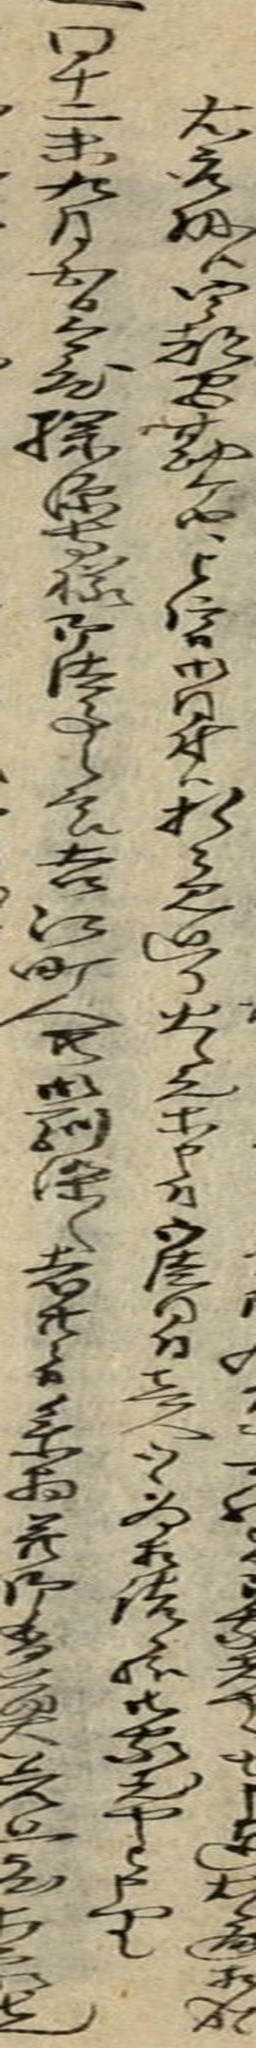一同十二未九月五日今度探源寺様御法事之節吉江町人共御馴染之者共に付参拝并御香奠差上度相願先
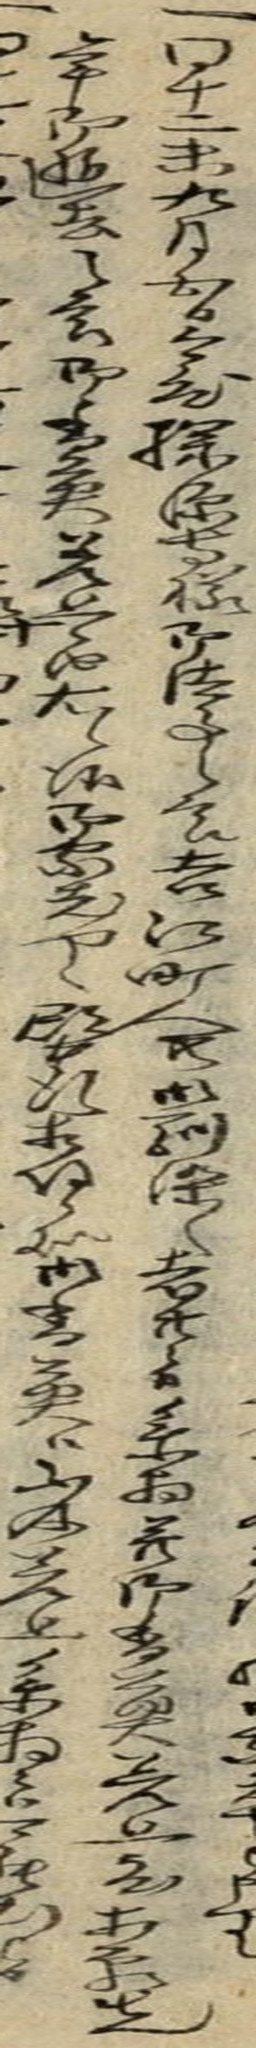年御逝去之節御香奠差上候由右之趣御家老中へ郡奉行相伺候処御香奠は不及差上参拝には可罷出旨
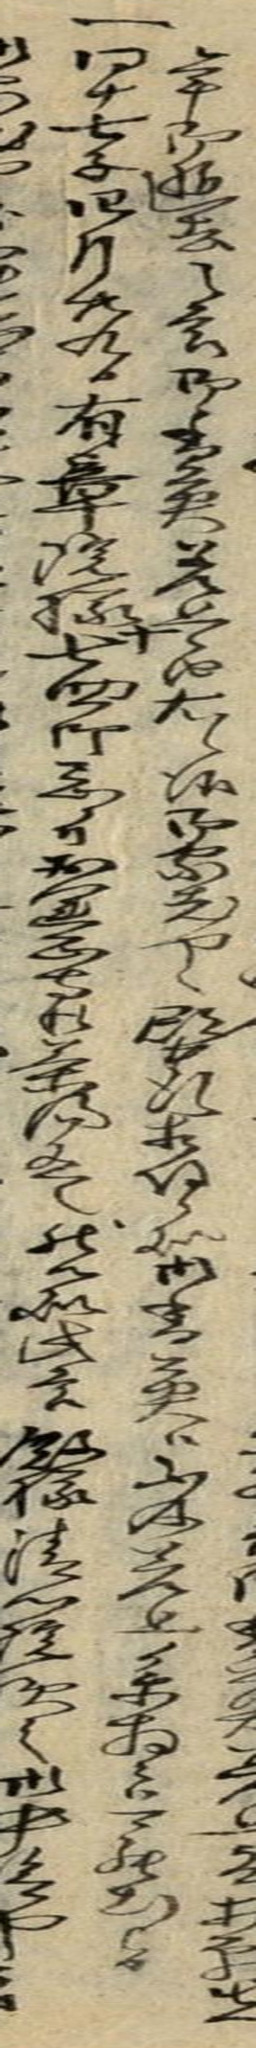一同十七子四月廿九日有章院様十七回御忌に付於運正寺御茶湯有之然処此節殿様清門院様之御中詰中に付
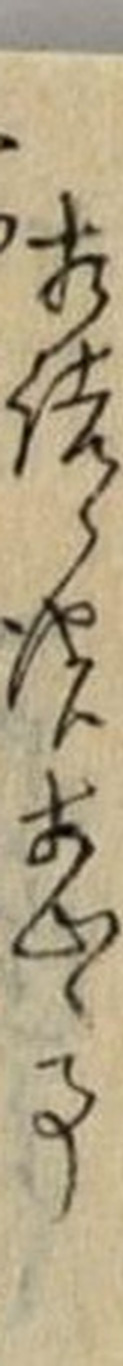相詰候儀は相止候事
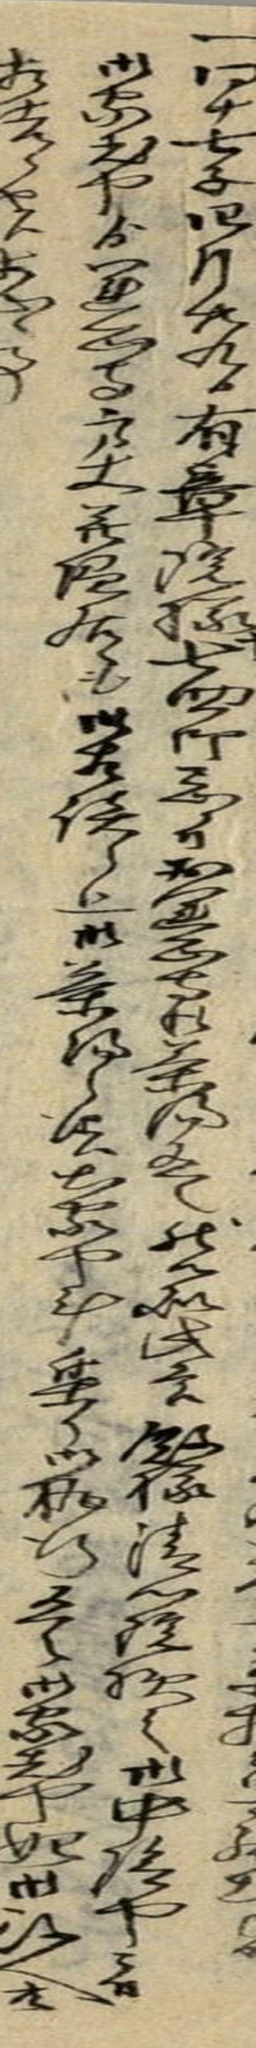御家老中ゟ運正寺方丈并隠居へも御相談之上御茶湯之儀は出家中斗集り御執行有之御家老中始御役人共
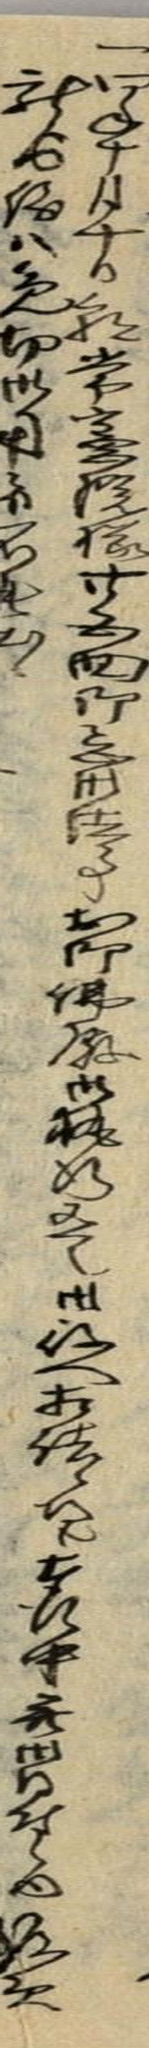一同年十月十日朝常憲院様廿五回御忌御法事於御仏殿御執行有之御役人相詰候得共奉行中并御目付之内渥美
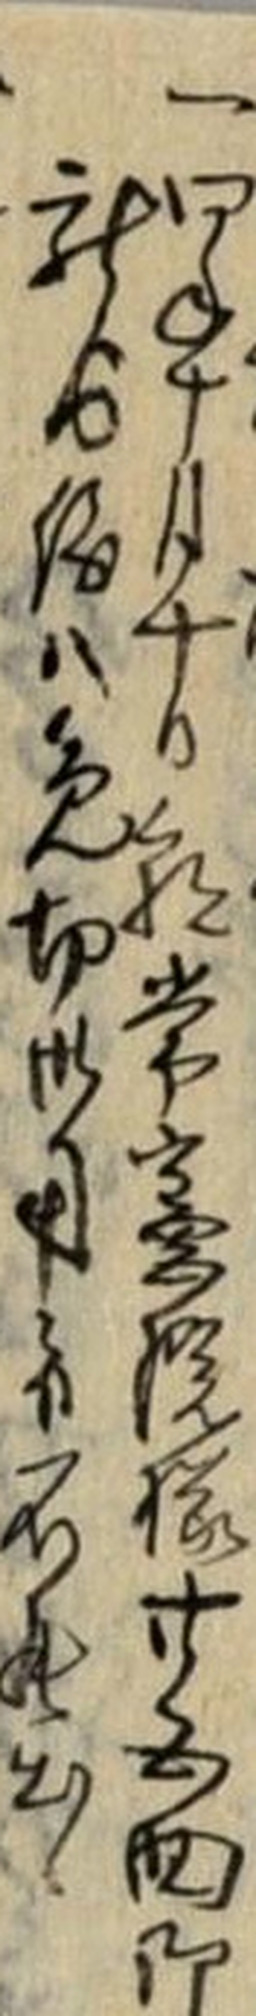新右衛門儀は急切御用に付不罷出候
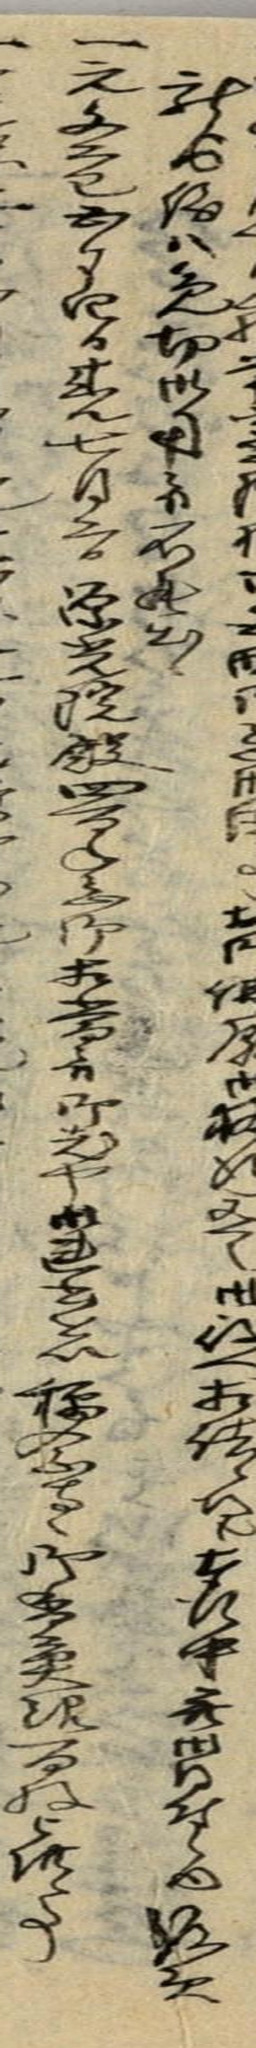一元文二巳五月四日来る七月二日源光院殿四百年忌御相当に付御老中連書を以称念寺へ御香奠銀百枚被供候事
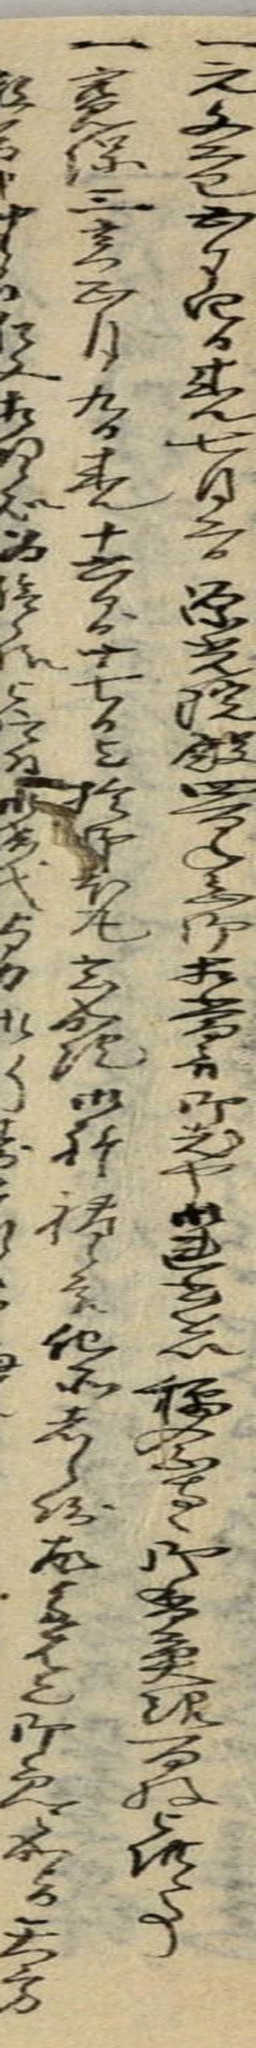一寛保三亥正月九日来る十六日ゟ十七日迄於御本丸玄成院御祈祷之節他所者之儀故たばこ御免被成候旨天方
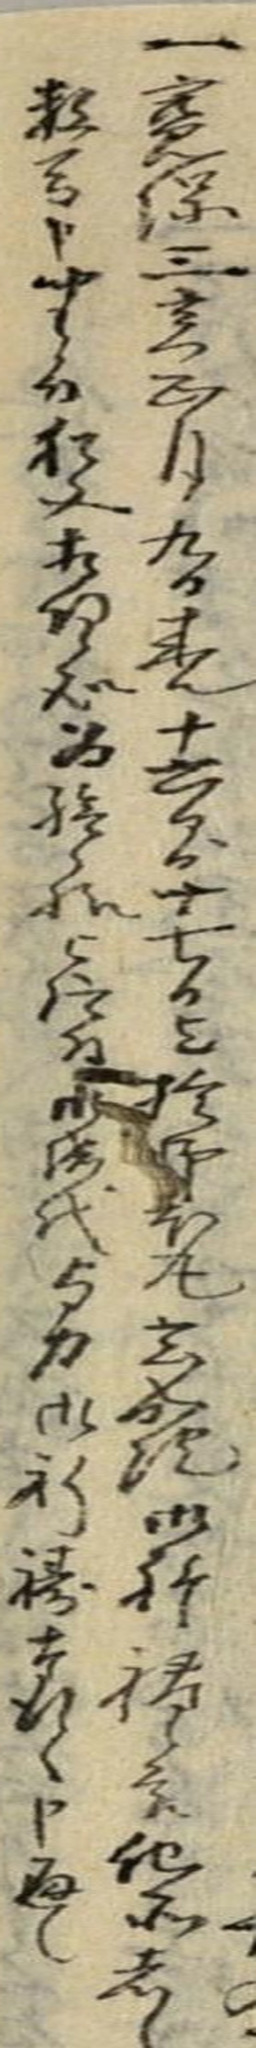数馬申聞候に付猶又相伺候処為給候様被仰付御城代与力御祈祷奉行へ申通候
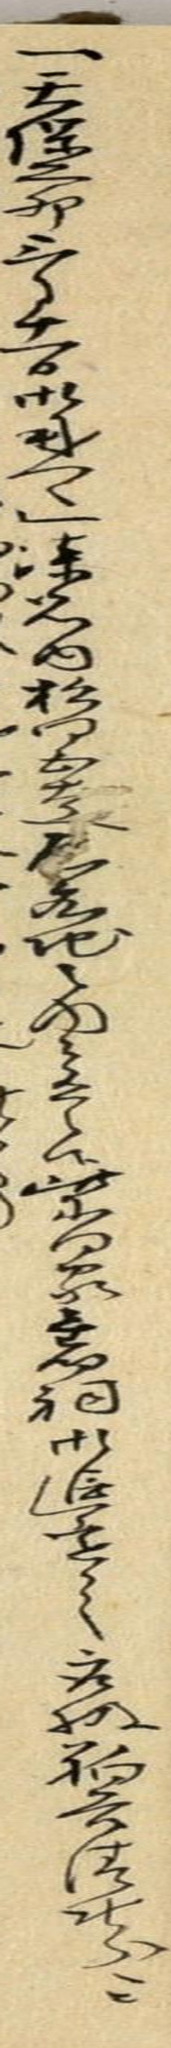一天保二卯三月十一日御用人へ」漆御門内杉田五太夫屋敷地之内に有之候柴田家叢祠御追遠之取扱粕谷清次郎へ被
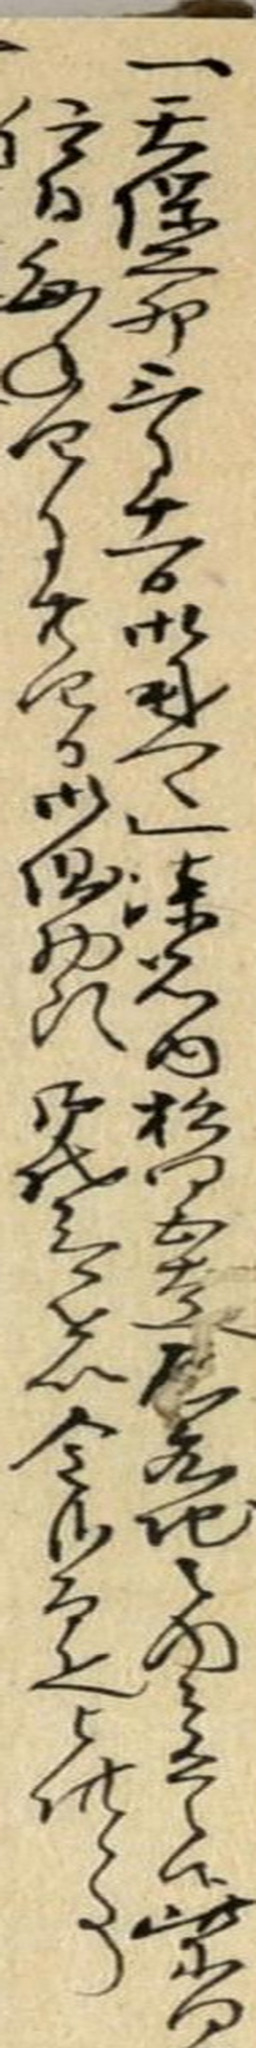仰付毎年四月廿四日御側物頭御代参を以金弐百疋被供候事
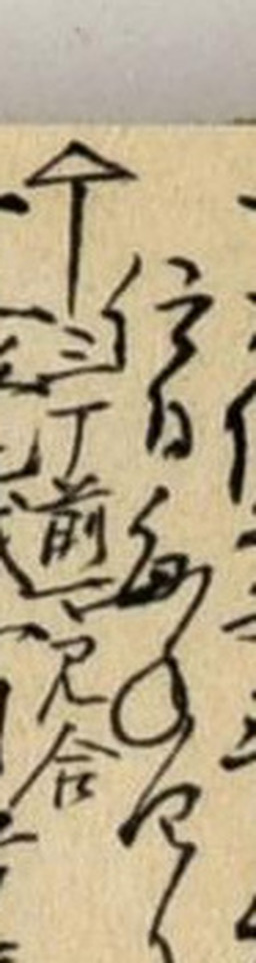仐三丁前可見合
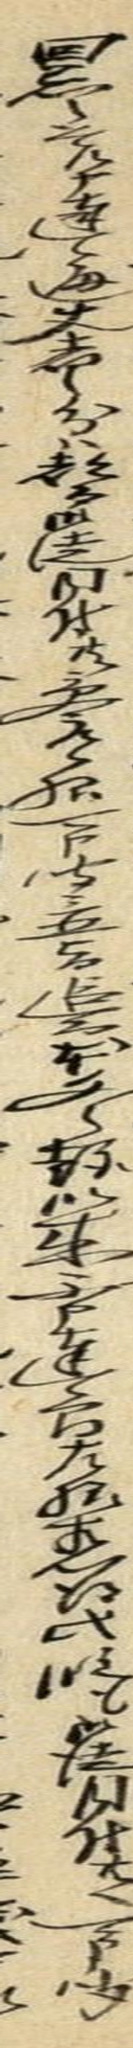回忌之節申達候通使者之分ハ都而御徒目付共受取候様可申聞置旨追而本文之趣以来不申達候間左様相心得此段も御徒目付共へ可申聞
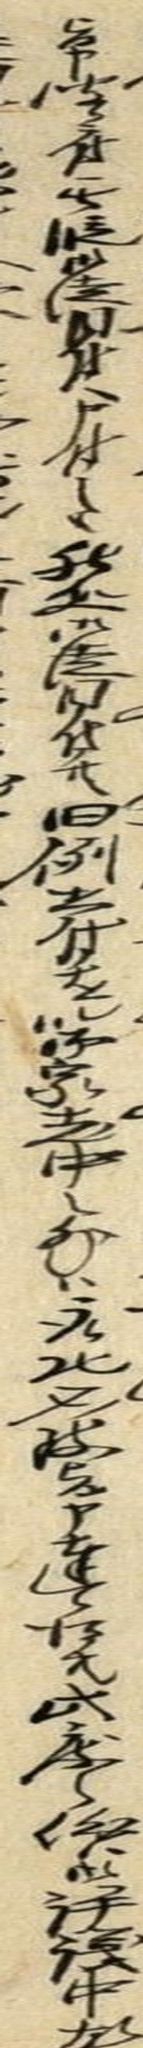旨申聞候ニ付其段御徒目付へ申付之候然処御徒目付共旧例書付を以御家老中之外は取次不致旨申達候得共此度之儀は評議中故
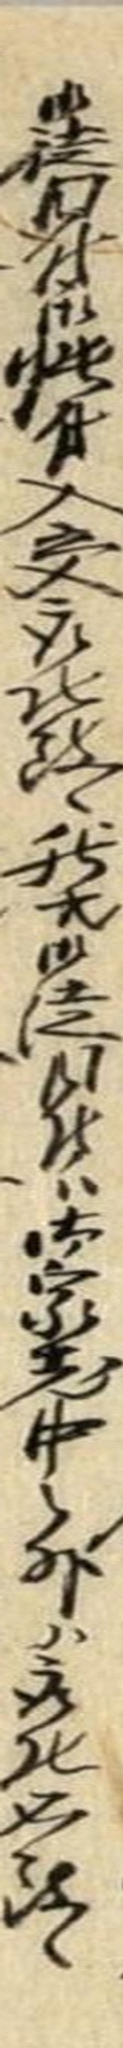御徒目付御帳付入交取次致候然共御徒目付は御家老中之外は取次不致候
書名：蒐輯之部
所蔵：福井県文書館 Fukui Prefectural Archives
